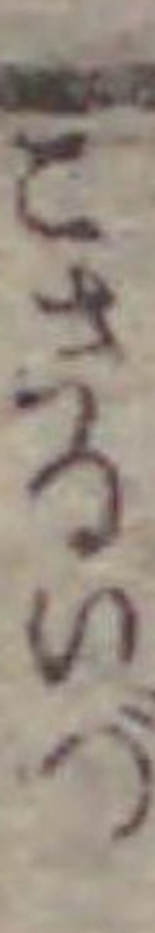こさるいづ
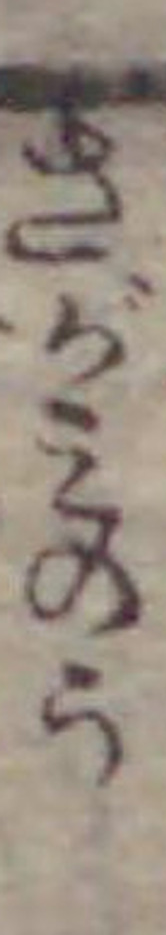さがみのう
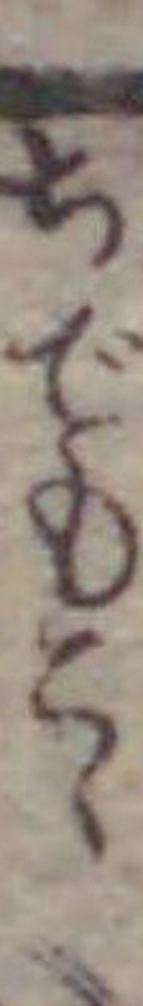ちでもこゝ
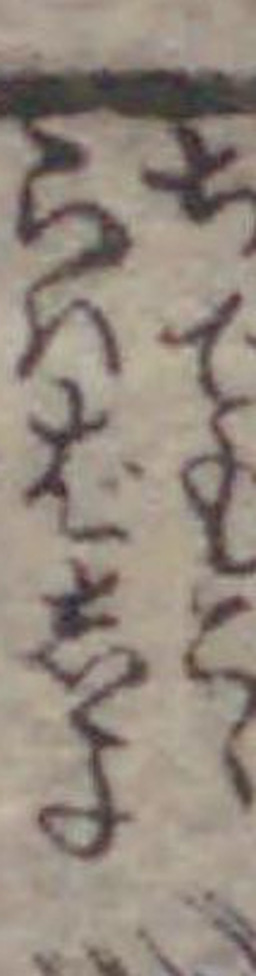らはばしよ
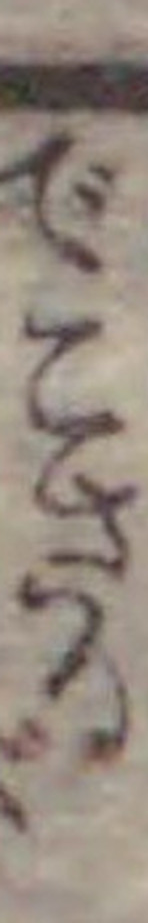でこさる
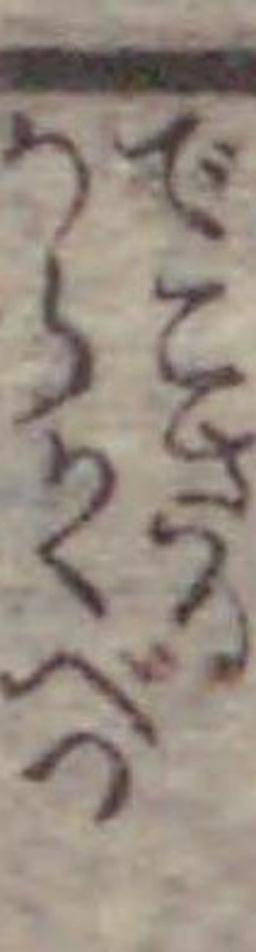からかくべつ
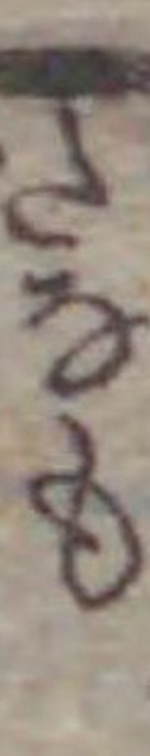たなも
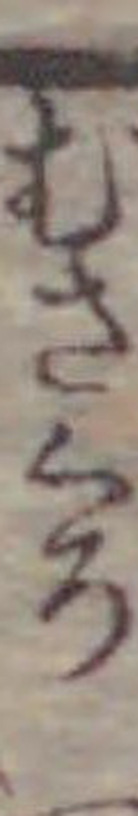むさくろ
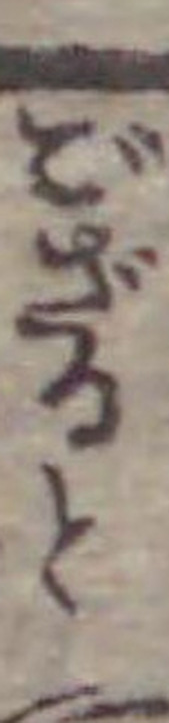ござると

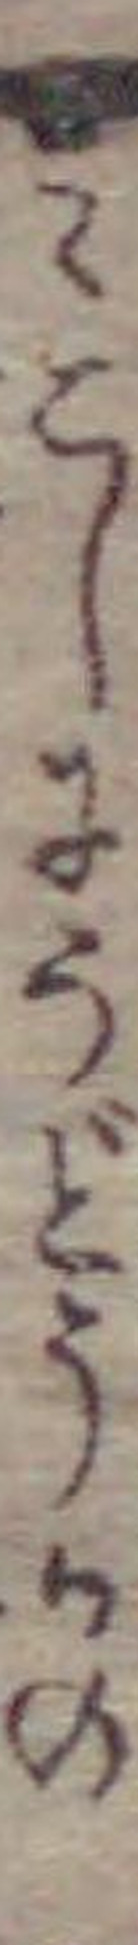みこしにうどうかの
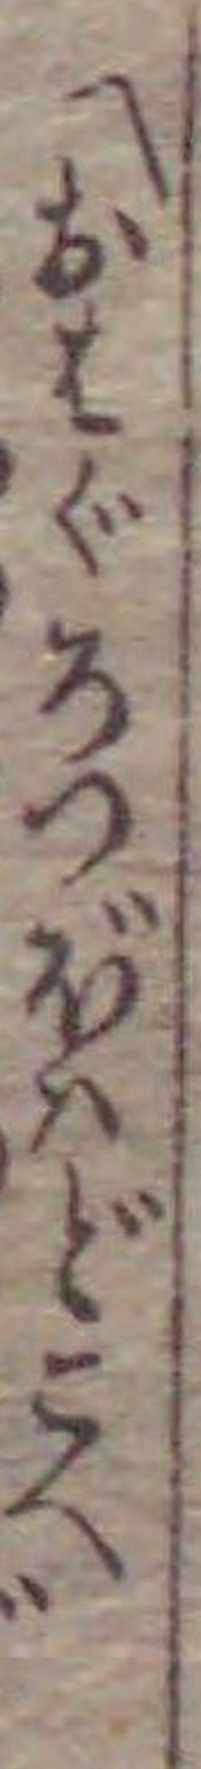〽おはぐろつぶはどこへ
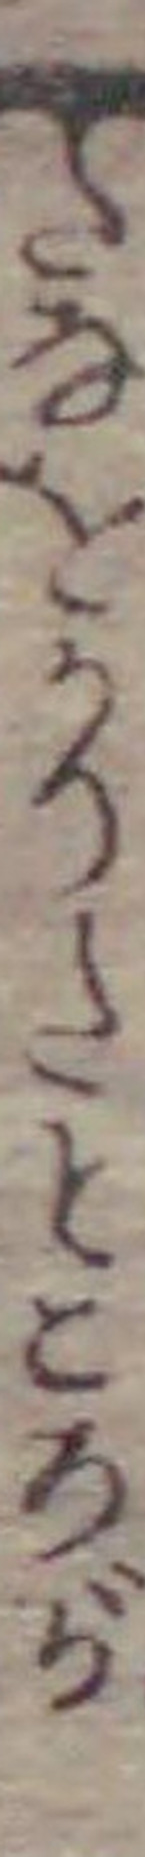たなをかりたところが
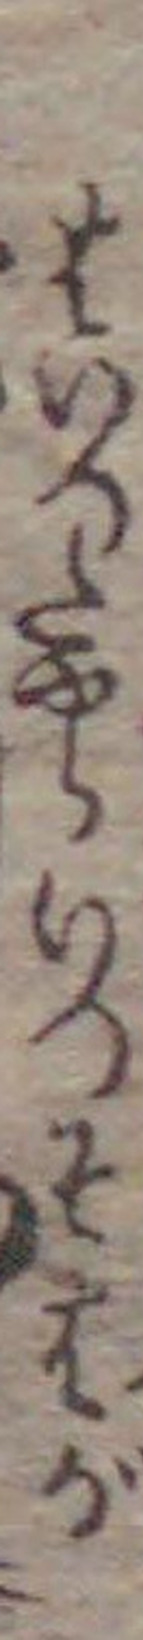はいつたやらいつそはが
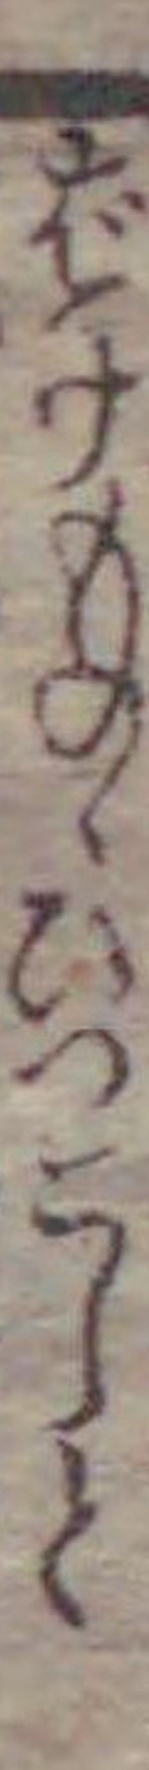ばけものゝひつこしと
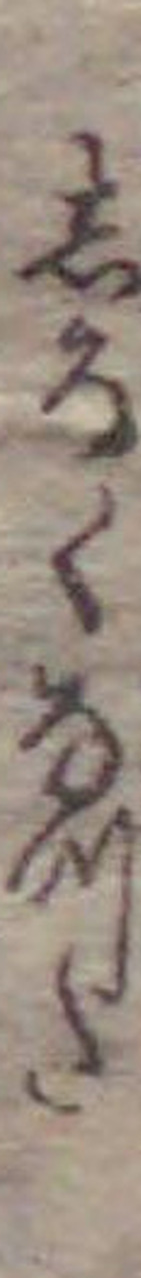しろくなつた
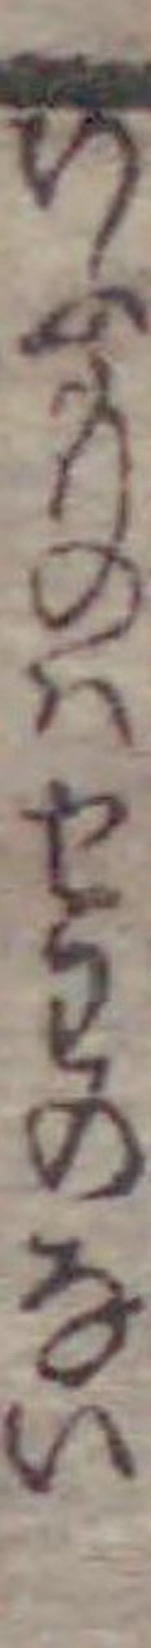いふものはせわのない
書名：化物見世開 : 2巻
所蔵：国立国会図書館 National Diet Library, JAPAN
